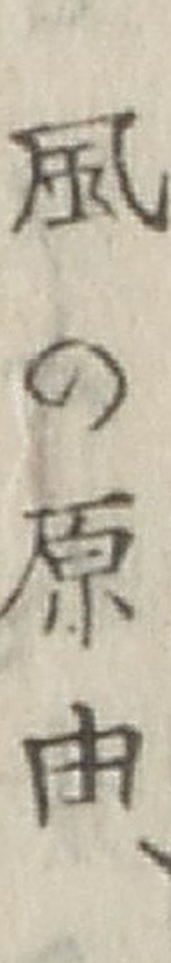風の原由、
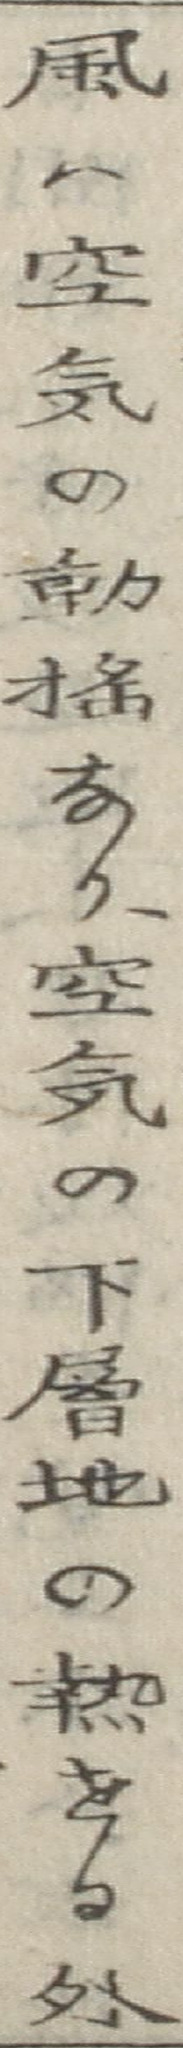風は空気の動揺なり、空気の下層地の熱せる外
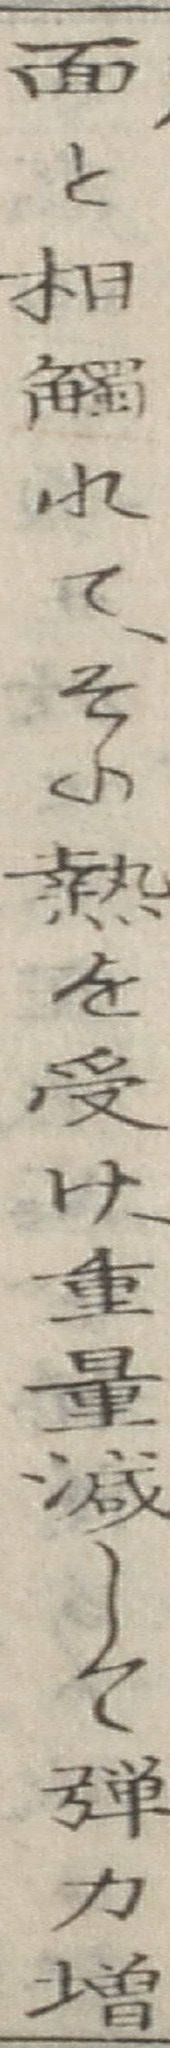面と相触れて、その熱を受け、重量減して弾力増
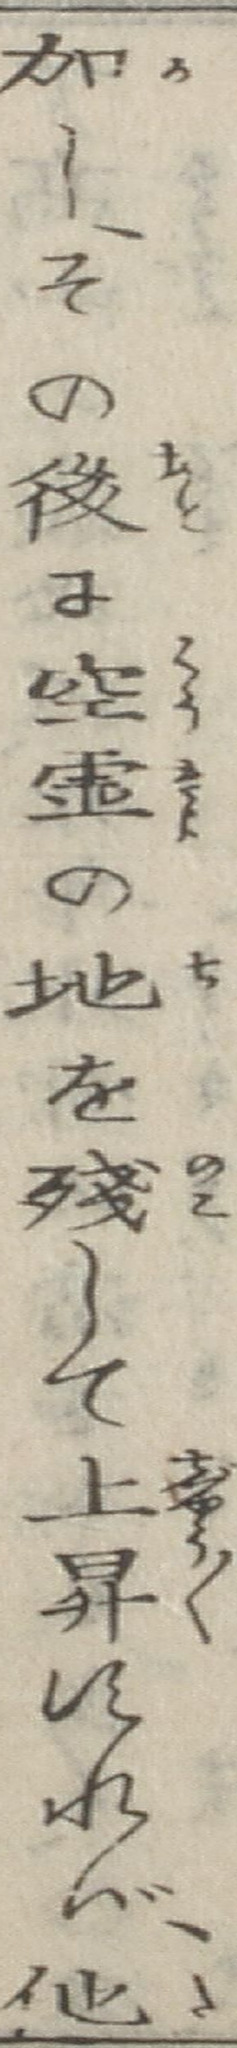加し、その後に空虚の地を残して上昇すれば、他
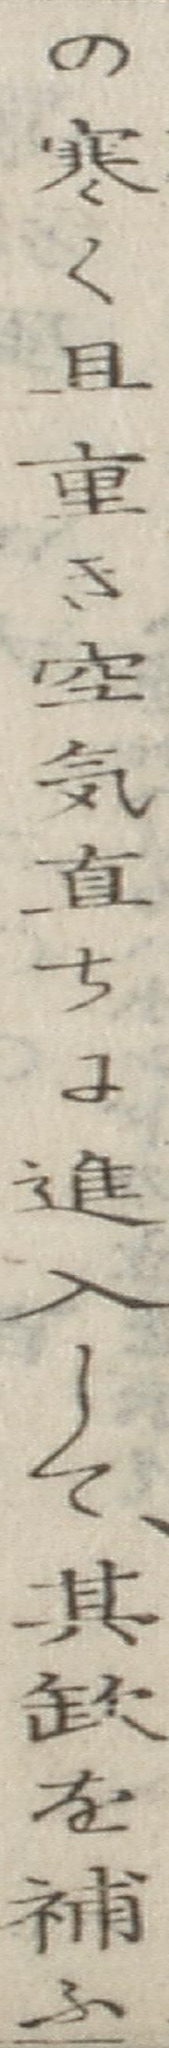の寒く且重き空気直ちに進入して、其欠を補ふ、
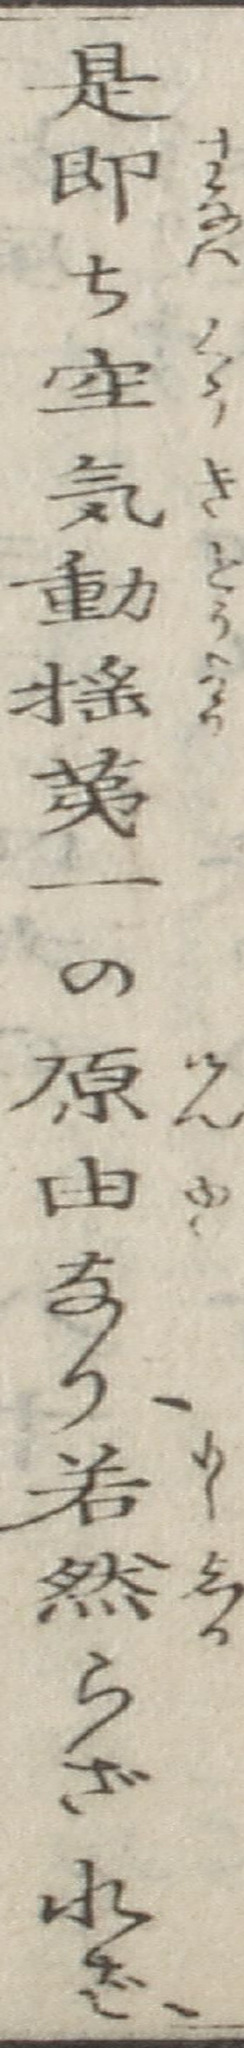是即ち空気動揺第一の原由なり、若然らざれば、
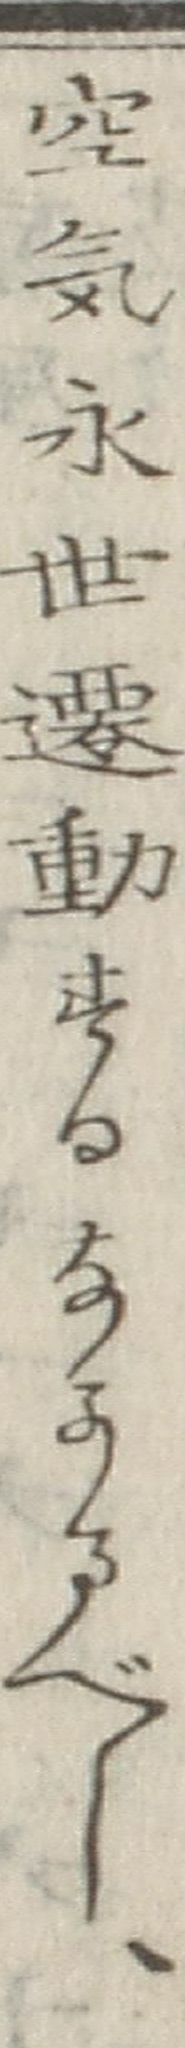空気永世遷動なかるべし、
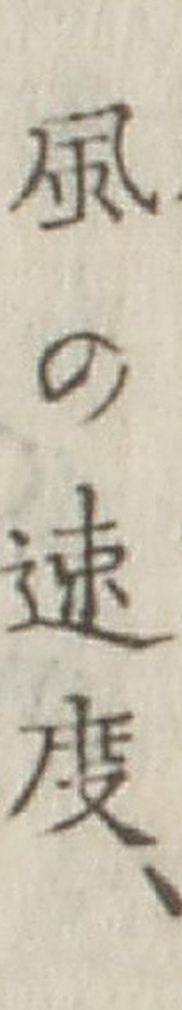風の速度、
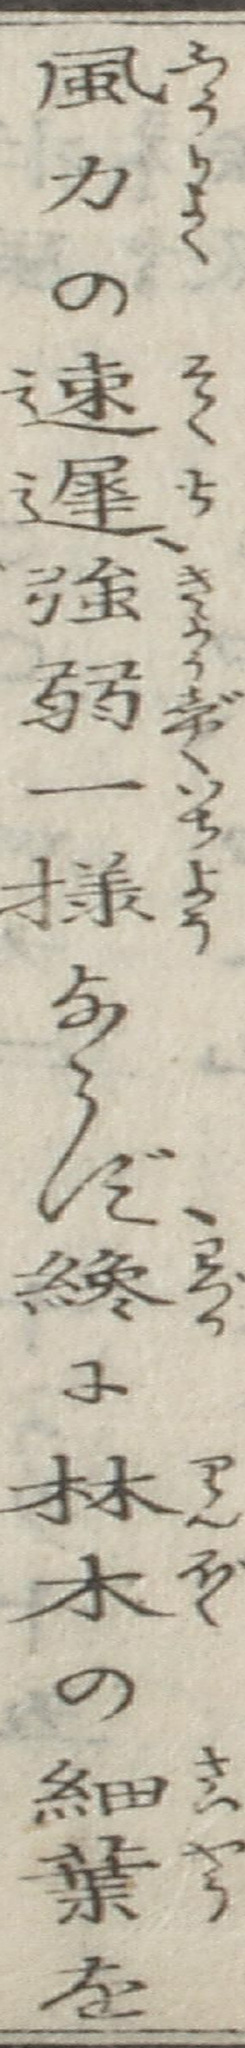風力の速遅、強弱一様ならず、纔に林木の細葉を
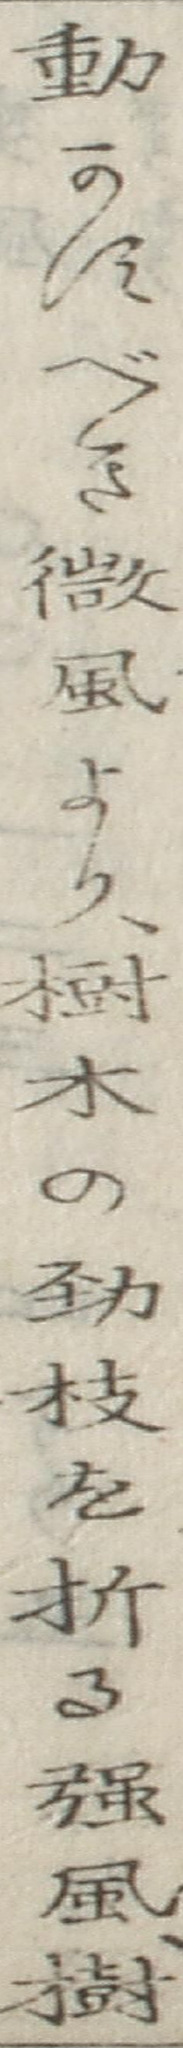動かすべき微風より、樹木の勁枝を折る強風、樹
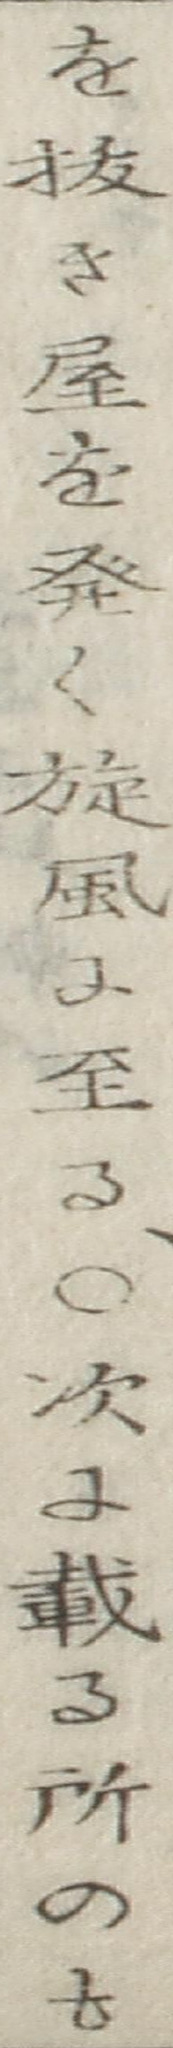を抜き屋を発く旋風に至る、〇次に載る所のも
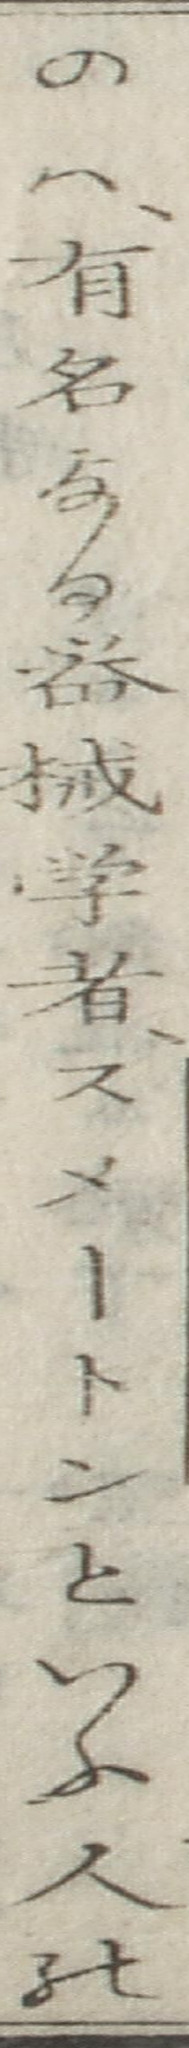のは、有名なる器械学者、スメートンといふ人の
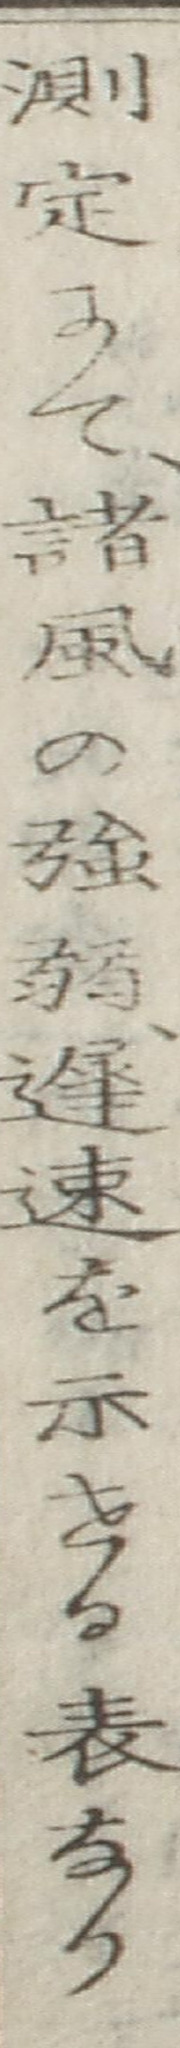測定にて、諸風の強弱、遅速を示せる表なり

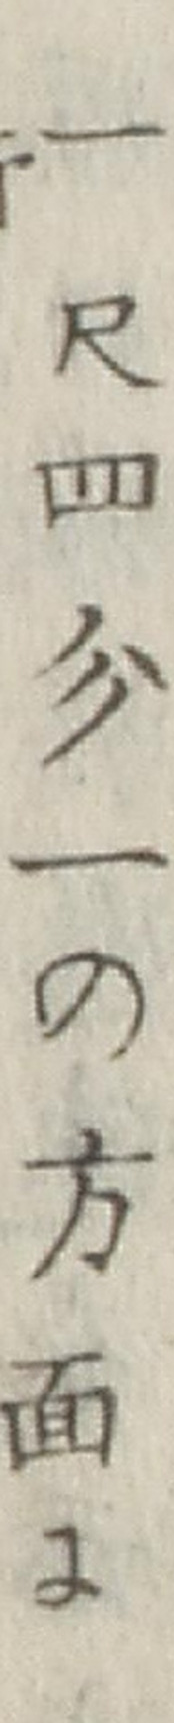一尺四分一の方面に
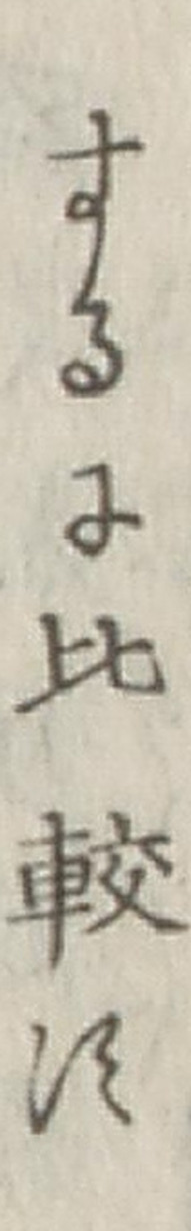するに比較す
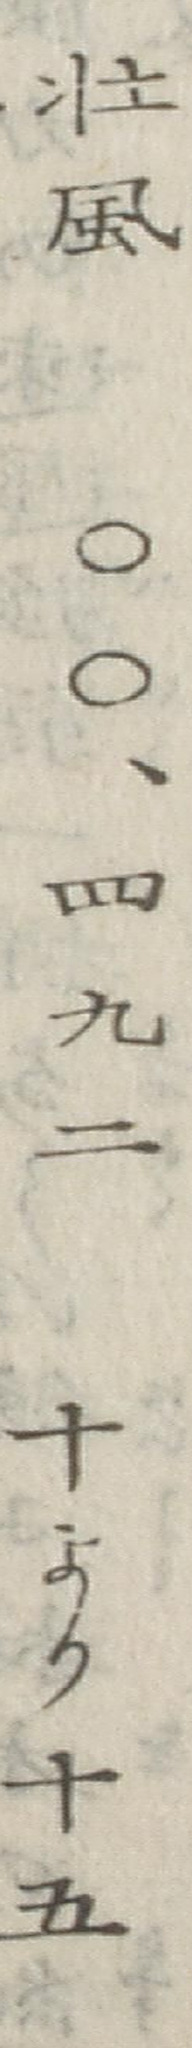壮風〇〇、四九二十より十五
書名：訓蒙　天然地理學　中
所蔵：東京大学地震研究所図書室 Earthquake Research Institute Library, The University of Tokyo, JAPAN
